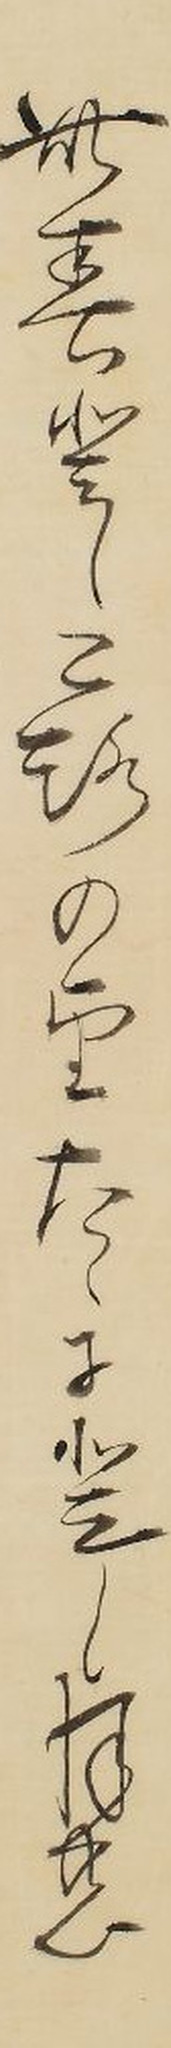此春としころの望たゝにとし月の
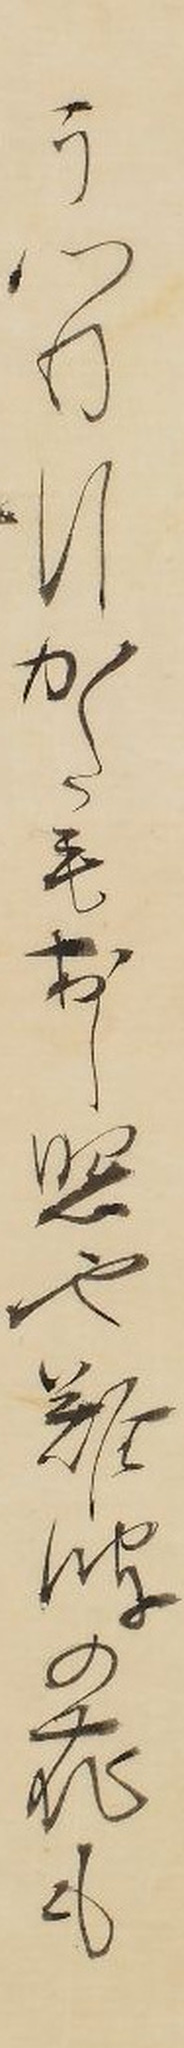うつり行かたもおし照や難波の花も
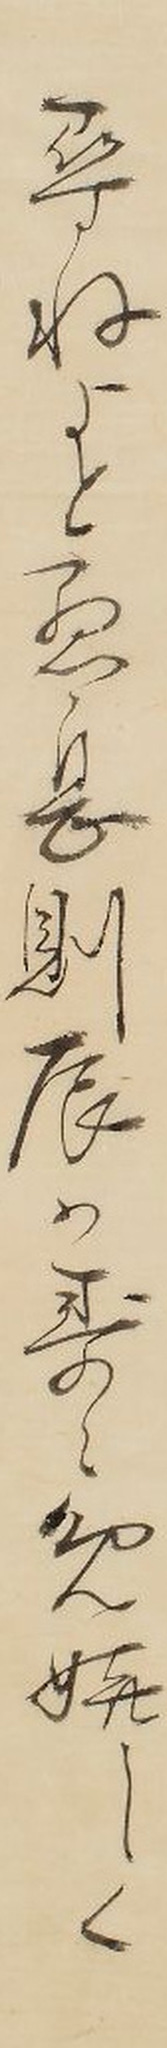尋ねよと愚息則辰かすゝめ嬉しく
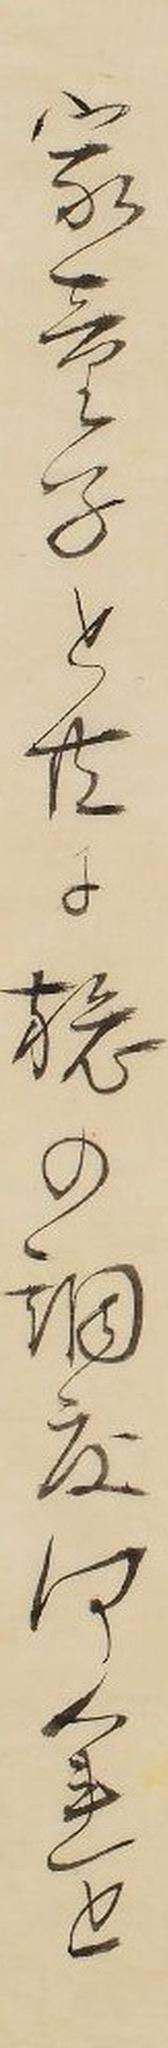家童子と共に旅の調度何くれと
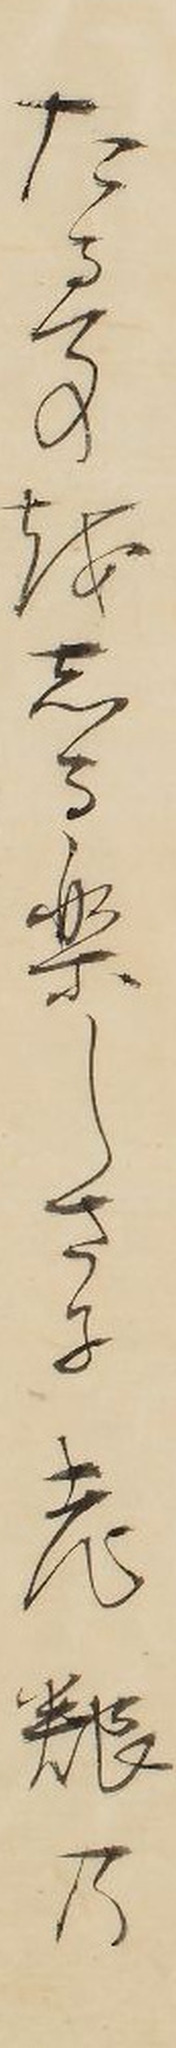たる事をしる楽しさに老艱の
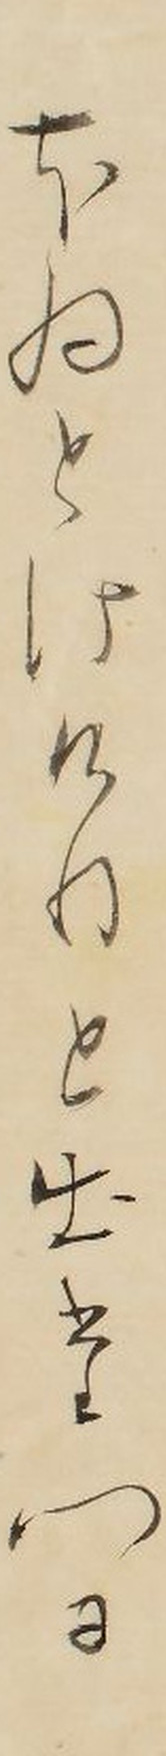ほゐとけけりと出た門に
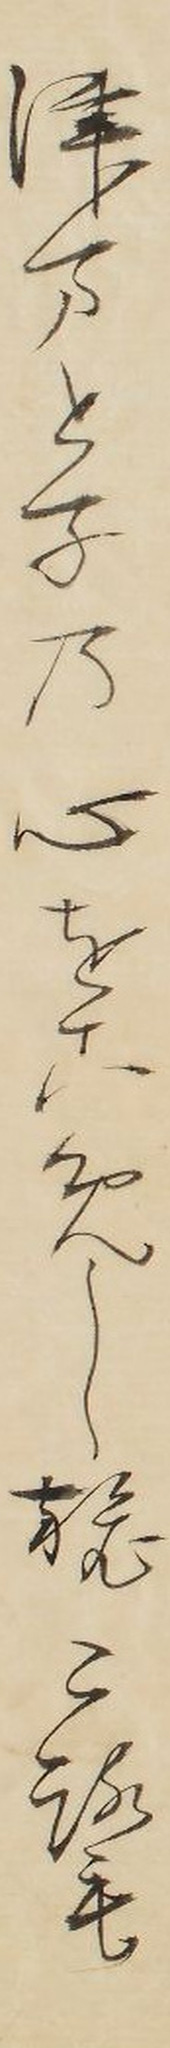つまと子の心をこめし旅ころも
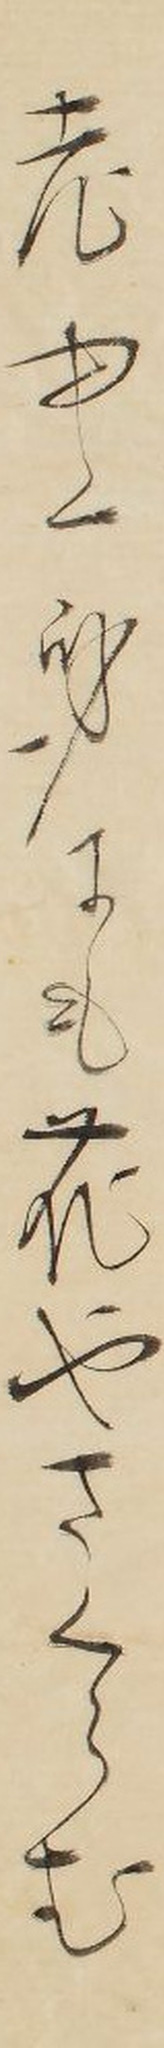老ゆく身にも花やさくらむ
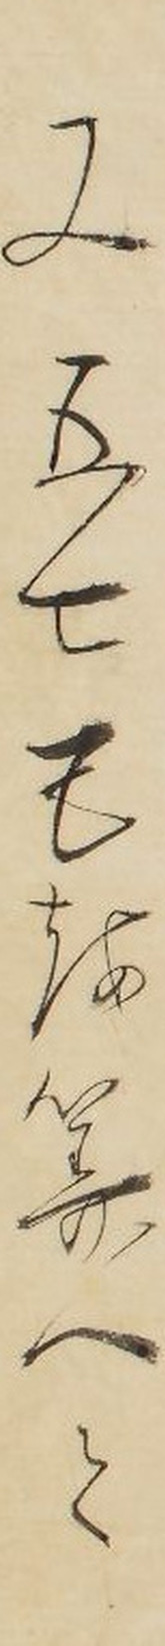又五七五を算へて

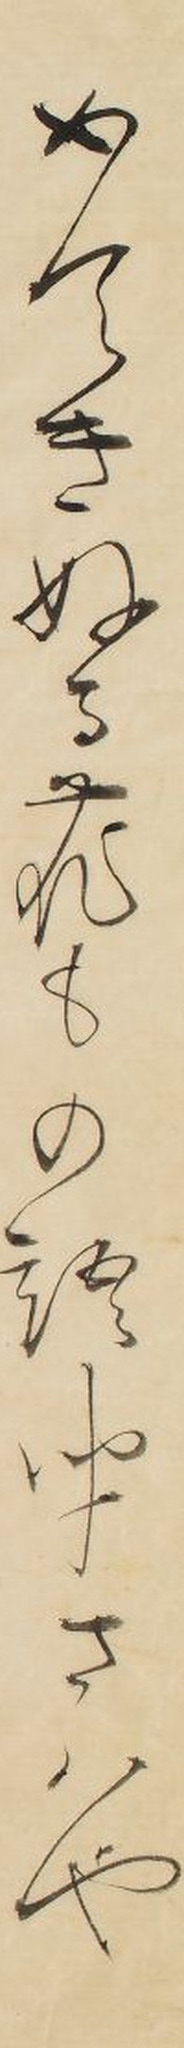めてきぬる花もの語聞さはや
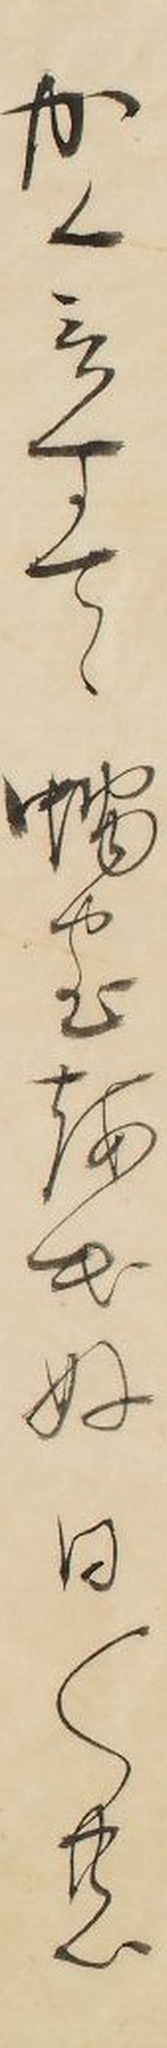かく言すてゝ蝸室を出ぬ日々の
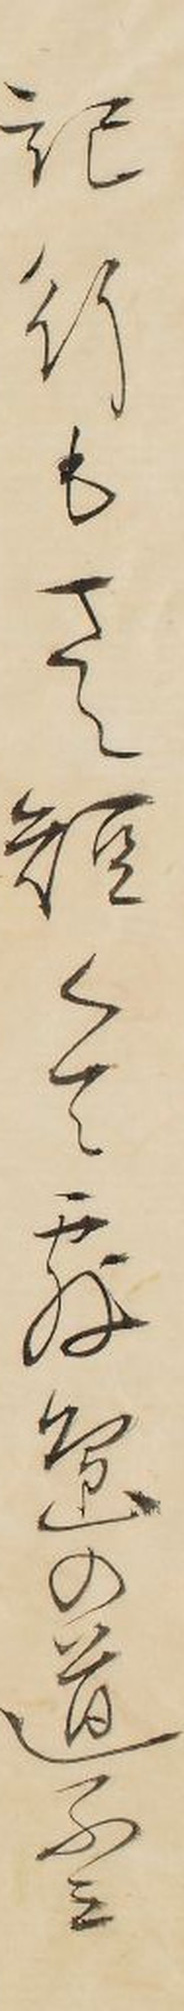記行もさえ短くて敷島の道ふみ
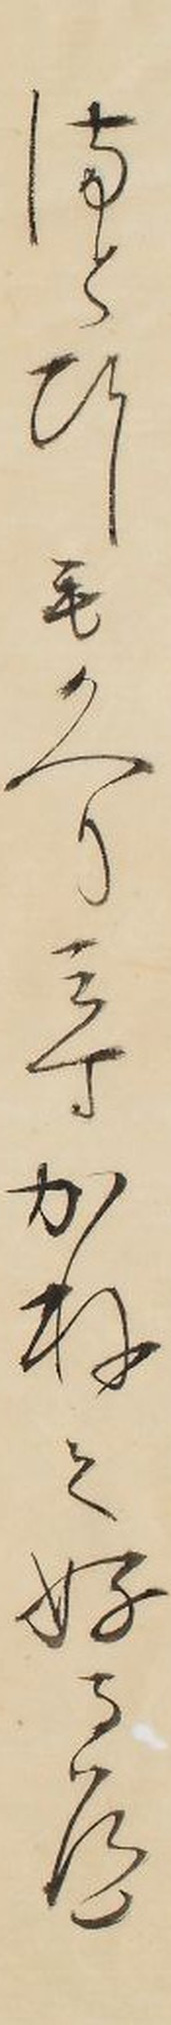まとひしもかへりみすかねて好る道
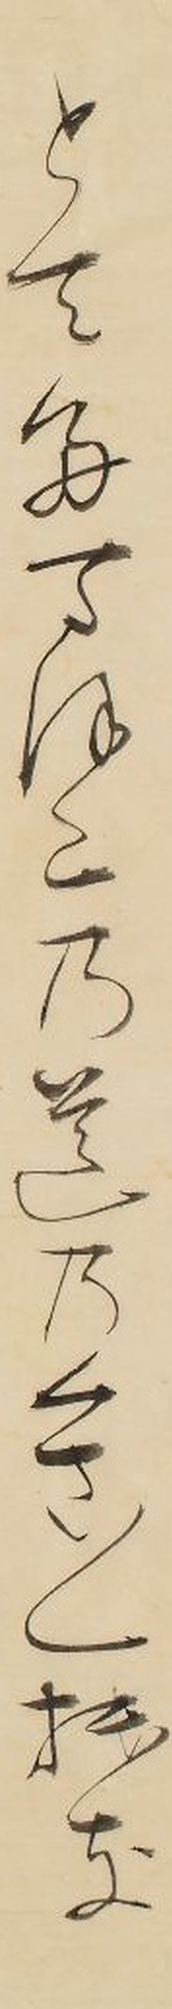とてたまほこの道のくさ〳〵拙き
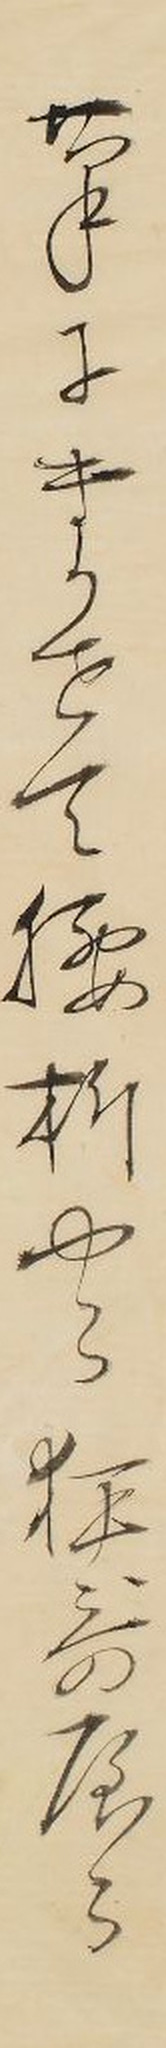筆にまかせて腰折やら狂歌やら
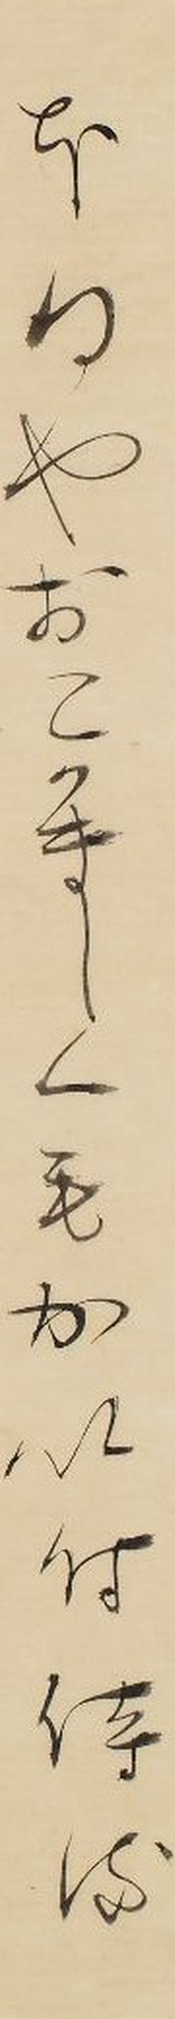本句やおこかましくもかい付侍る
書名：花土産
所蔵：徳島県立図書館
